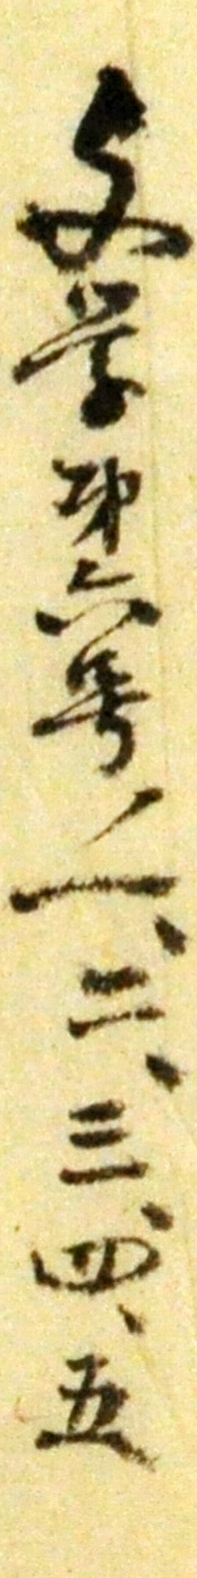与学第六号ノ一、二、三、四、五
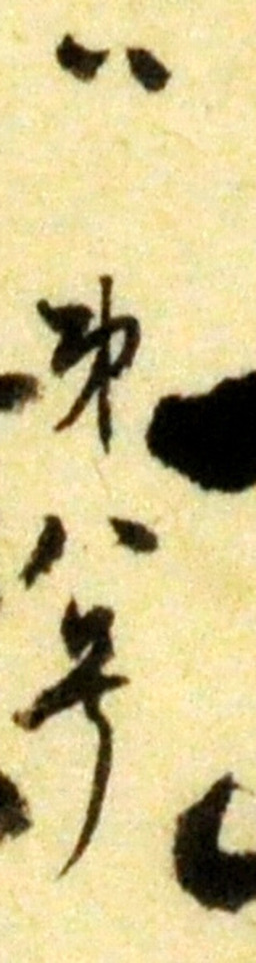同第八号
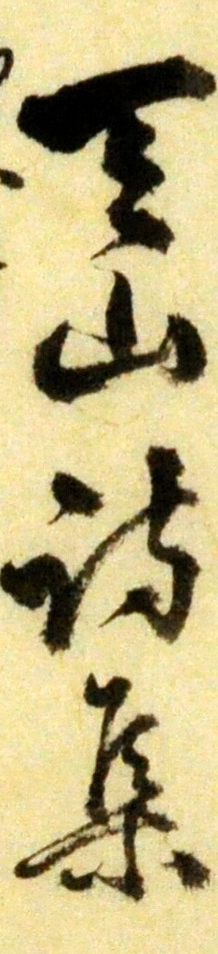天山詩集
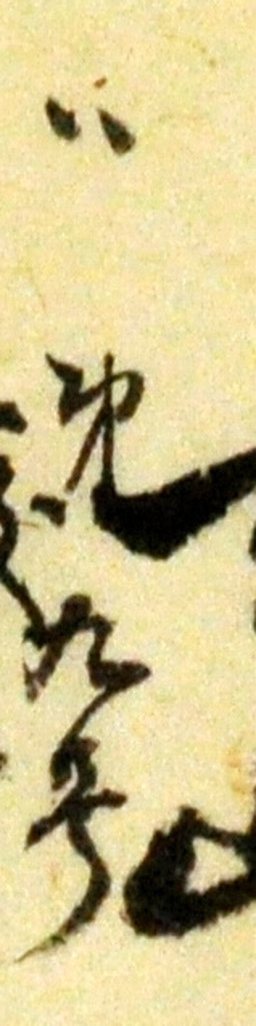同第九号
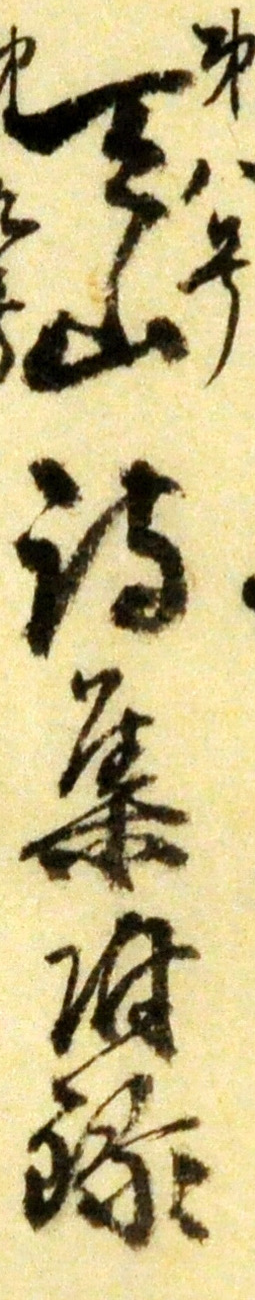天山詩集附録
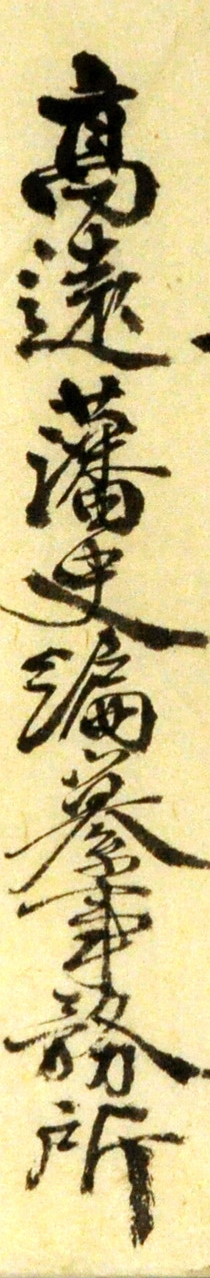高遠藩史編纂事務務所
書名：天山詩集、天山詩集付録、天山文集
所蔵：伊那市立高遠町図書館・合同会社AMANE
